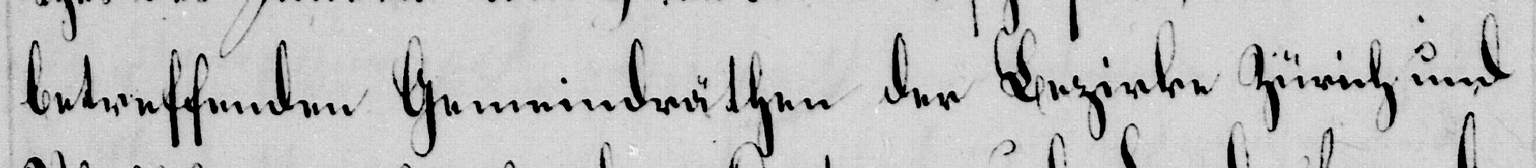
betreffenden Gemeindräthen der Bezirke Zürich und
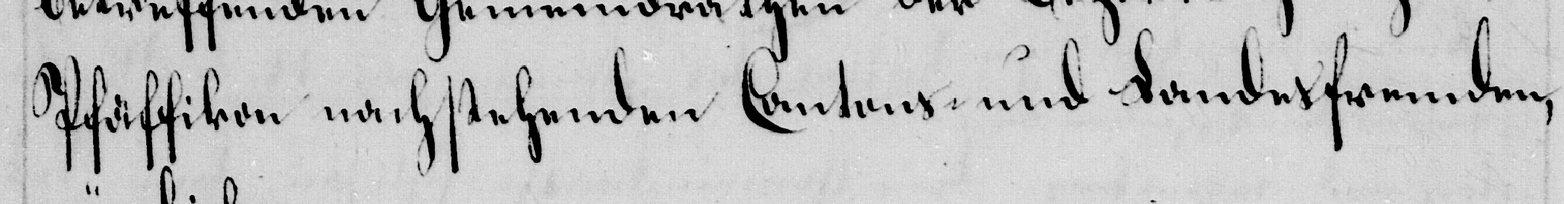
Pfäffikon nachstehenden Cantons- und Landesfremden,
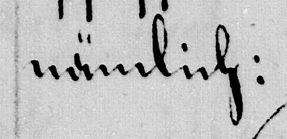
nämlich;
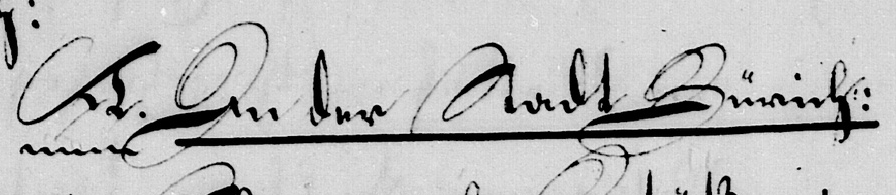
A. In der Stadt Zürich:
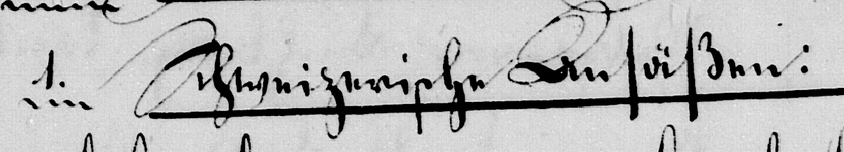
1. Schweizerische Ansäßen:
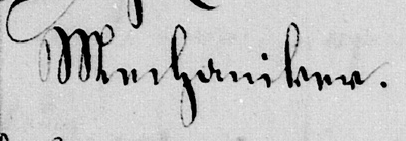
Mechaniker.
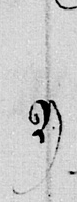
8.)
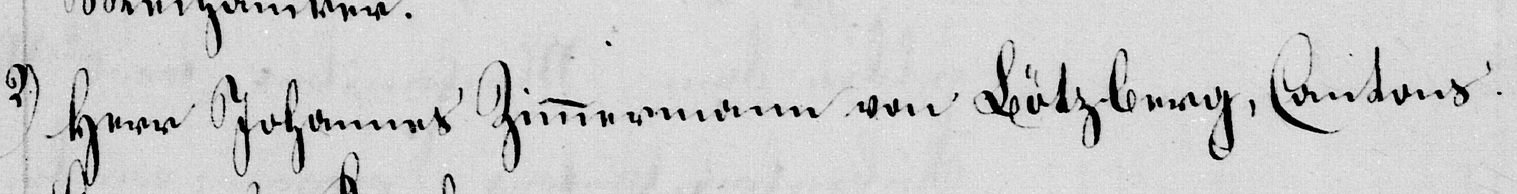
Herr Johannes Zimmermann von Bötzberg, Cantons
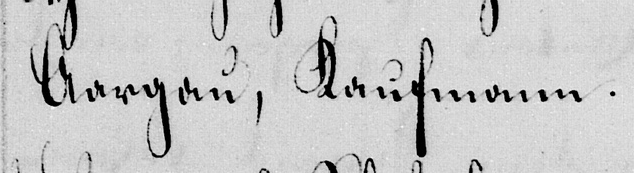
Aargau, Kaufmann.
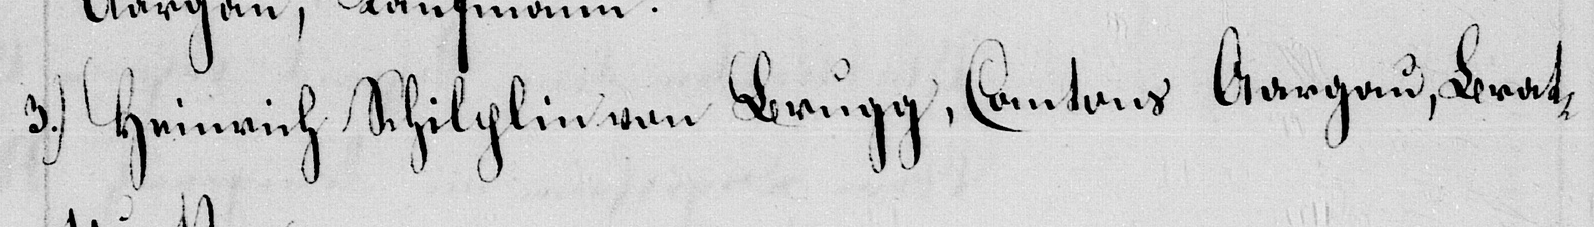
3.) Heinrich Schilplin von Brugg, Cantons Aargau, Brat¬
